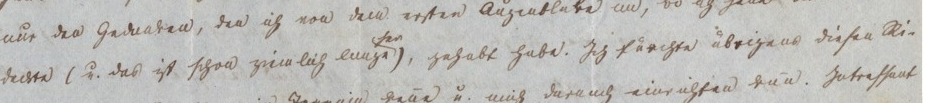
deckte (u. das ist schon ziemlich lange her), gehabt habe. Ich befürchte übrigens diesen Ri-
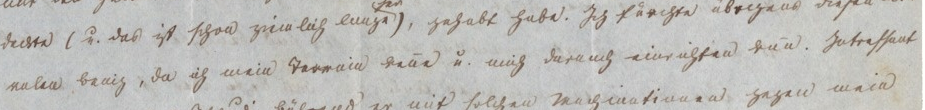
valen wenig, da ich mein Terrain kenne u. mich darnach einrichten kann. Intressant
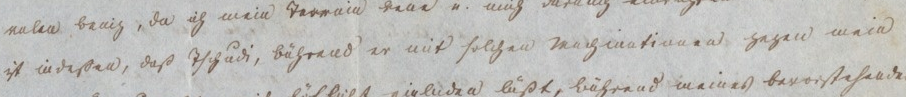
ist indessen, daß Tschudi, während er mit solchen Machinationen gegen mein
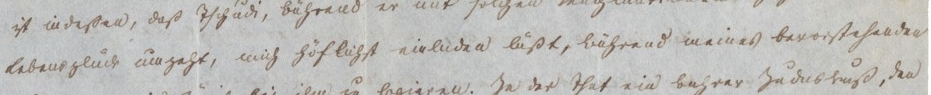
Lebensglück umgeht, mich höflichst einladen läßt, während meines bevorstehenden
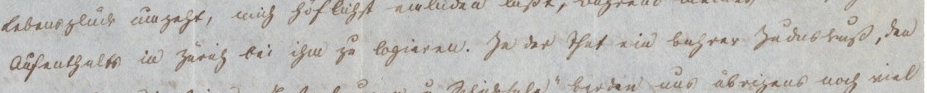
Aufenthalts in Zürich bei ihm zu logieren. In der That ein wahrer Judaskuß, den
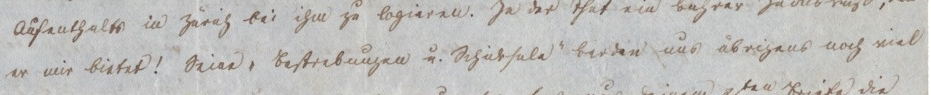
er mir bietet! Seine «Bestrebungen u. Schicksale» werden uns übrigens noch viel
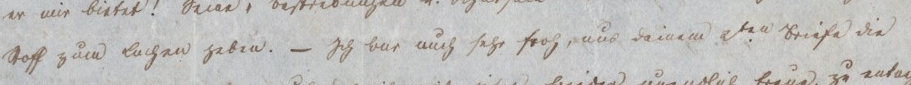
Stoff zum Lachen geben. – Ich war auch sehr froh, aus deinem 2ten Briefe die
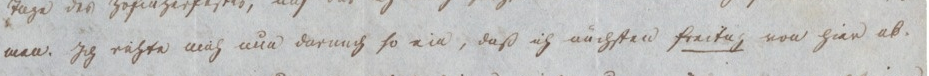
men. Ich richte mich nun darnach so ein, daß ich nächsten Freitag von hier ab-
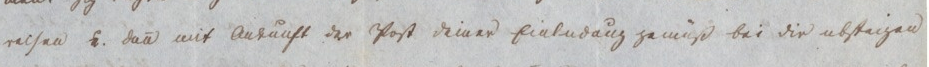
reisen u. dann mit Ankunft der Post deiner Einladung gemäß bei dir absteigen
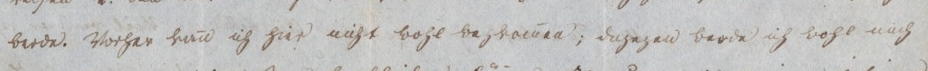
werde. Vorher kann ich hier nicht wohl wegkommen; dagegen werde ich wohl nach
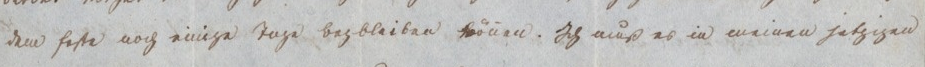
dem Feste noch einige Tage wegbleiben können. Ich muß es in meinen jetzigen
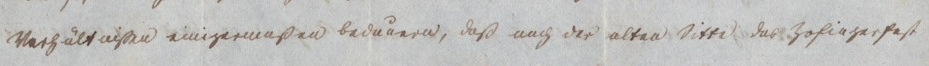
Verhältnissen einigermaßen bedauern, daß nach der alten Sitte das Zofingerfest
